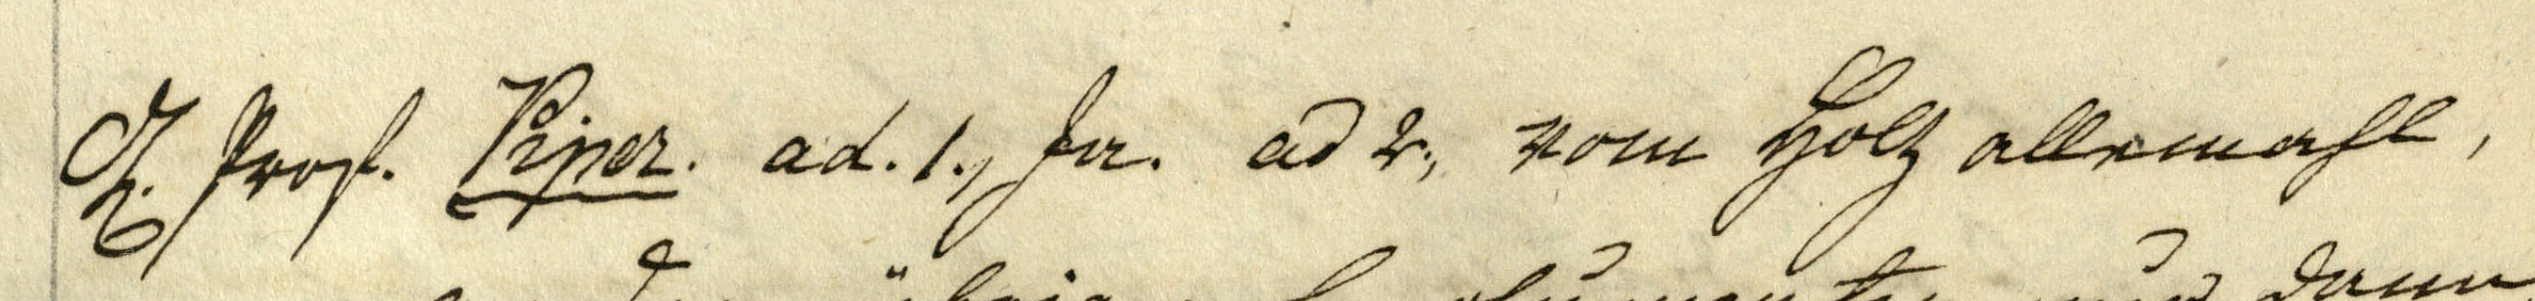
dh. Prof. Piper. ad 1., Ja. ad 2. vom Holz allemahl,
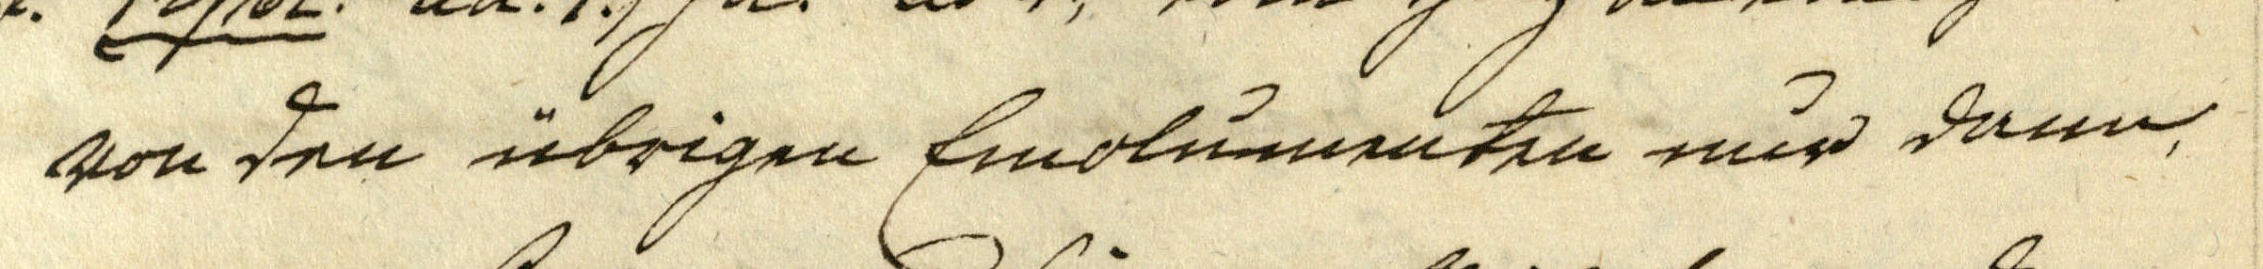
von den übrigen Emolumenten nur dann,
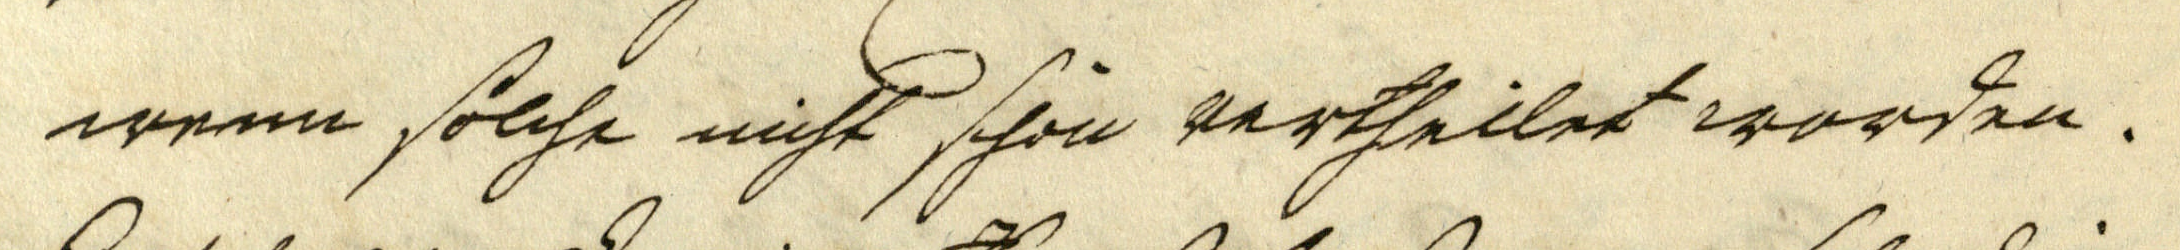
wenn solche nicht schon vertheilet worden.
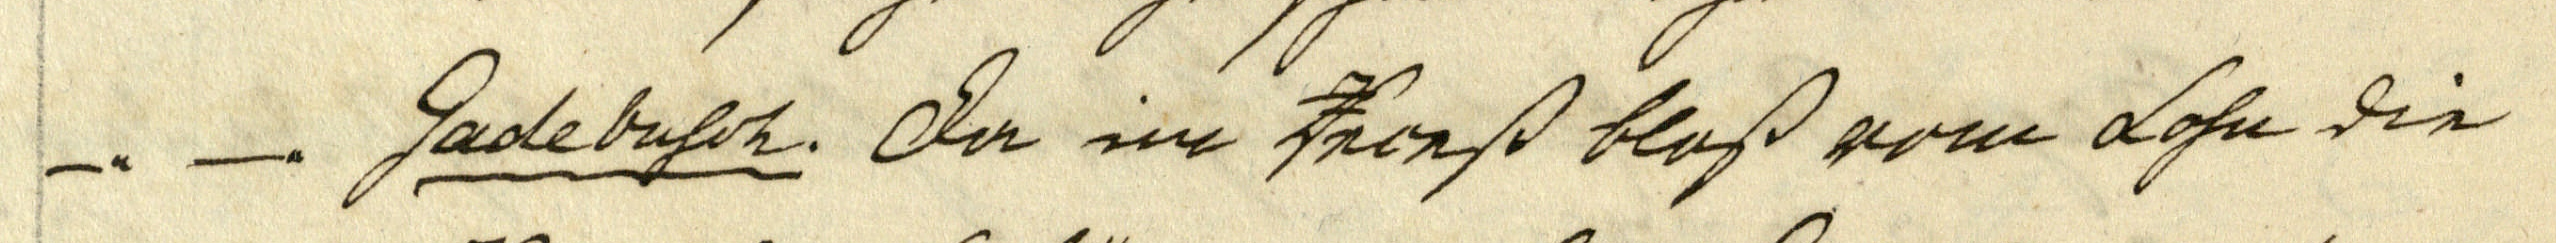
Gadebusch. Da im Receß bloß vom Lohn die
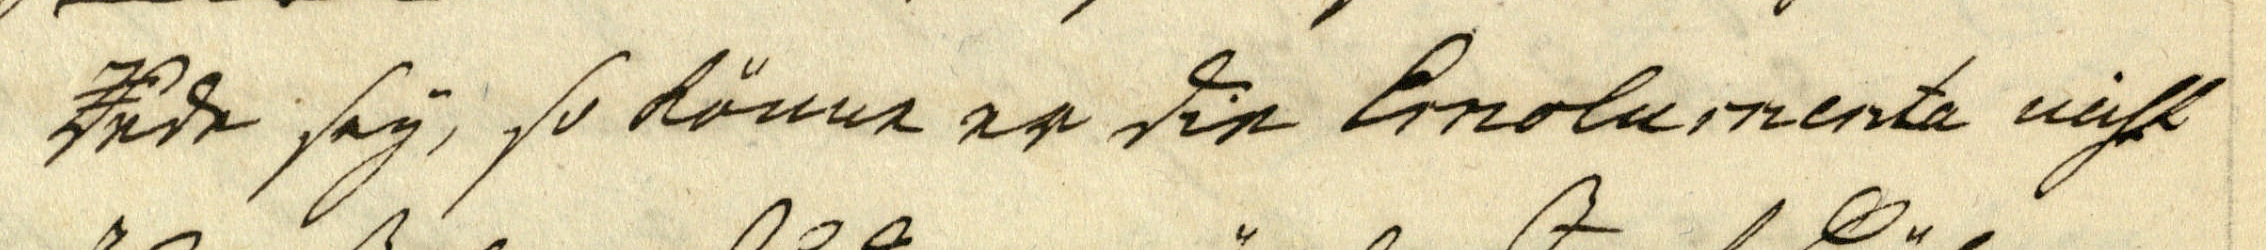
Rede seÿ, so könne er die Emolumente nicht
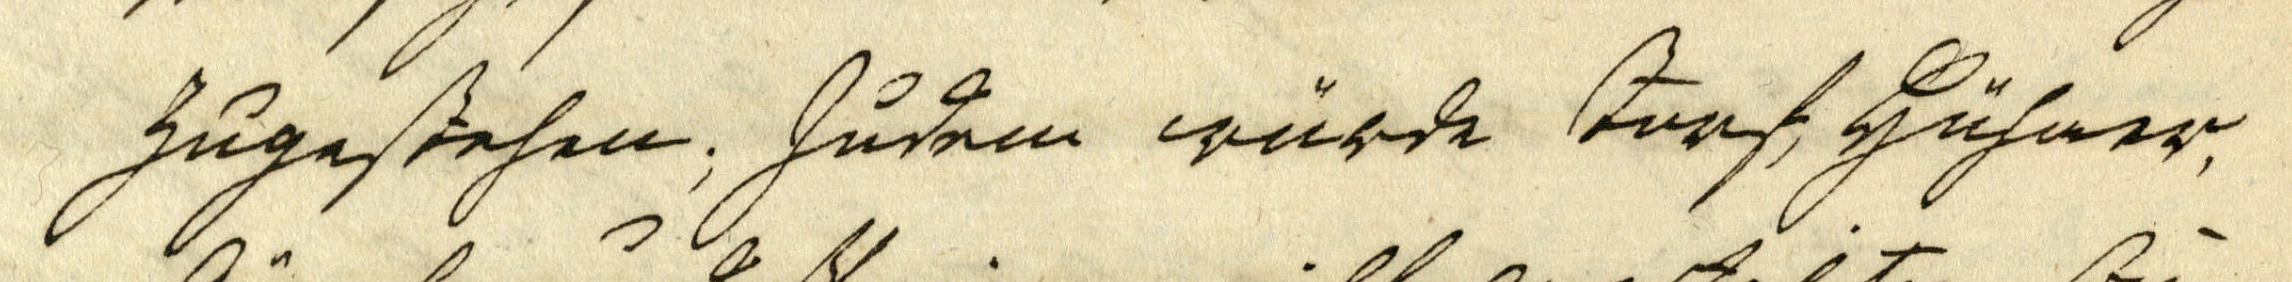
zugestehen; zudem würde Torf, Hühner,
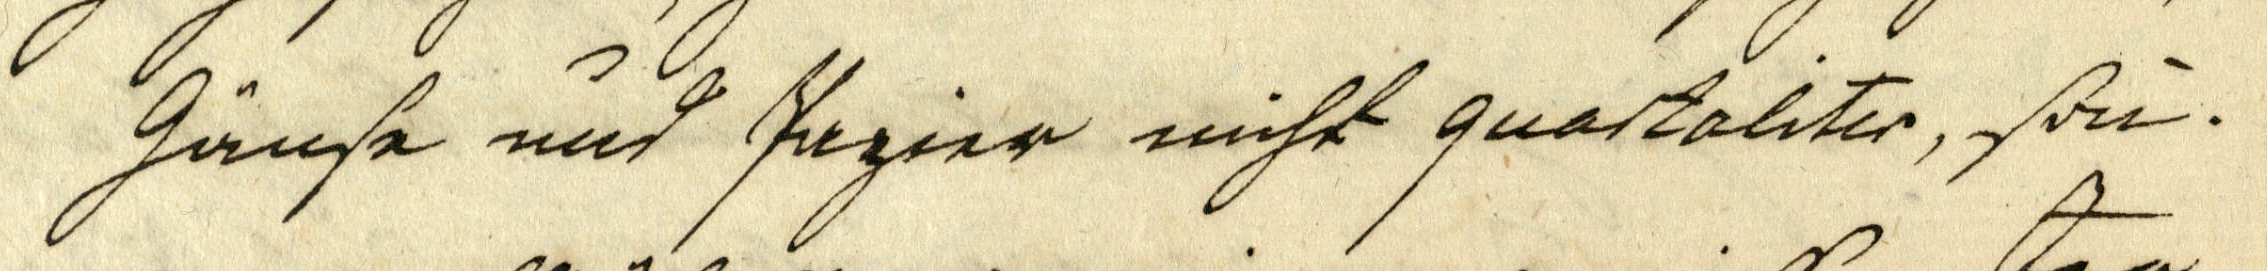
Gänse und Papier nicht quartaliter, son¬
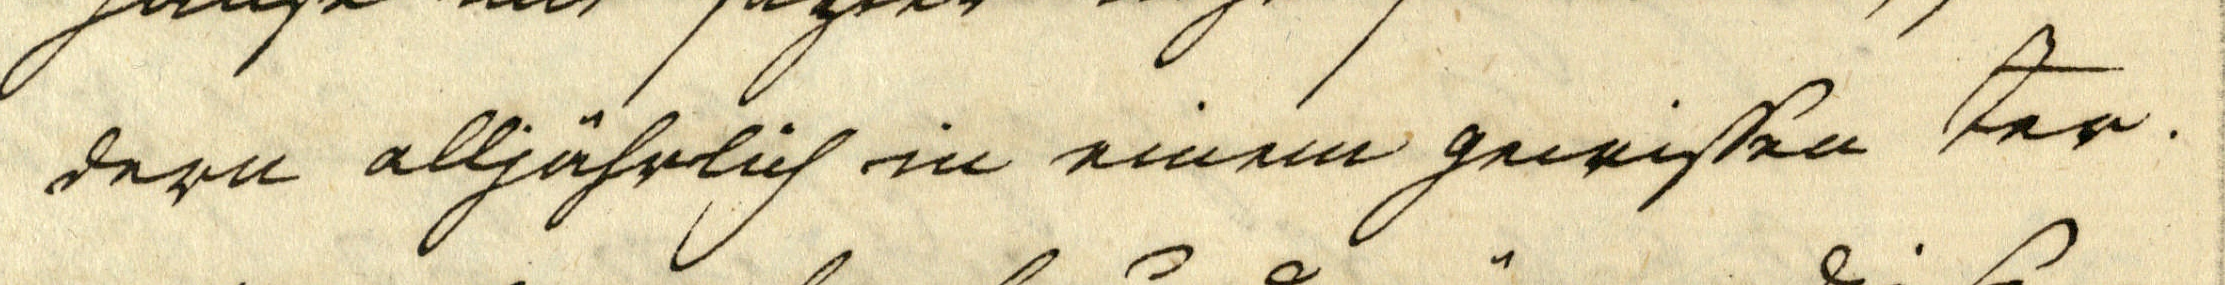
dern alljährlich im einem gewissen Ter¬
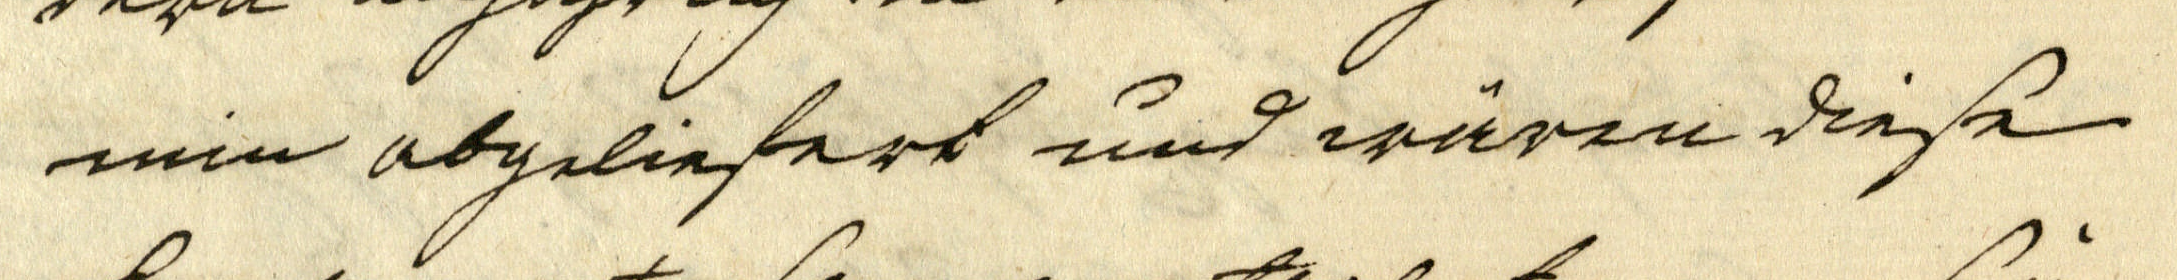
min abgeliefert und wären diese
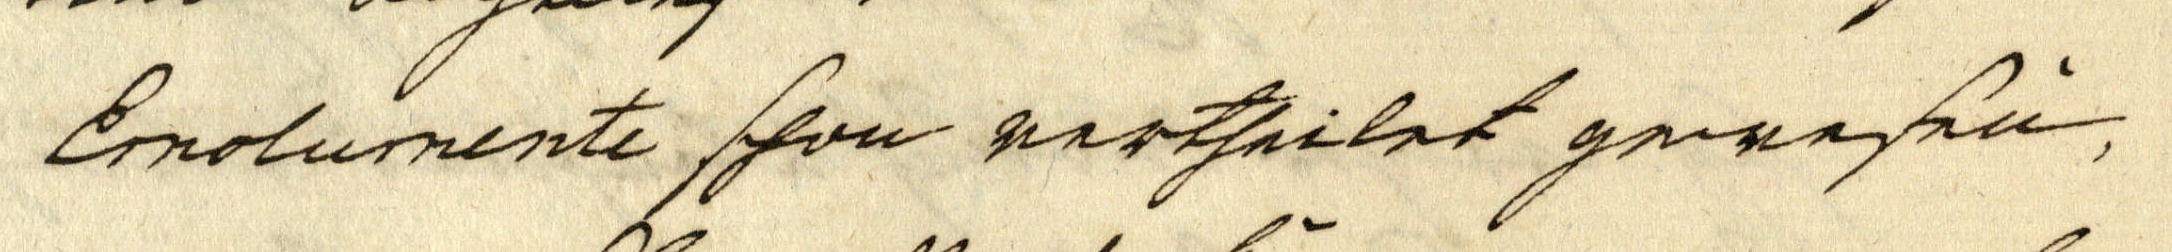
Emolumente schon vertheilet gewesen,
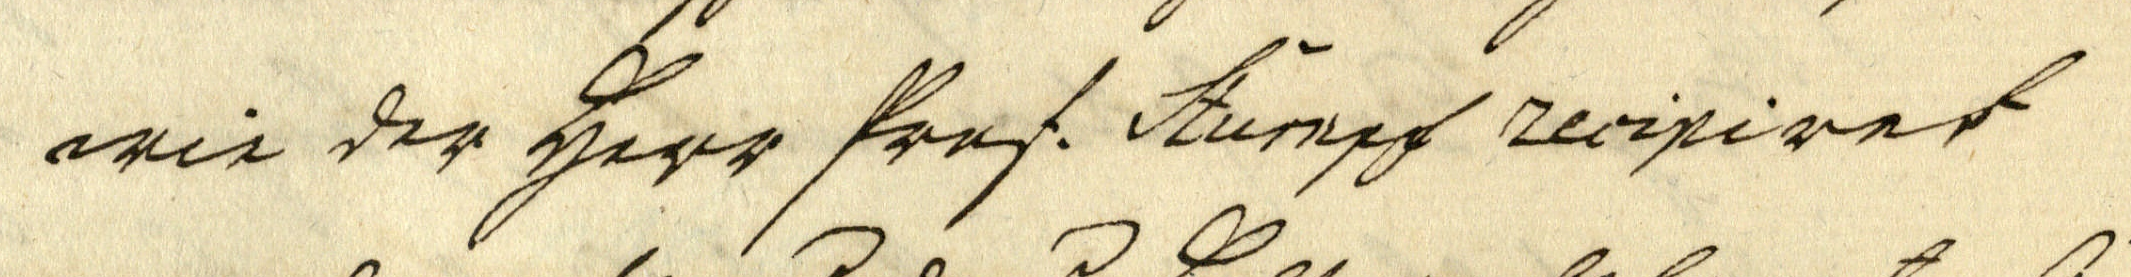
wie der Herr Prof. Stumpf recipiret
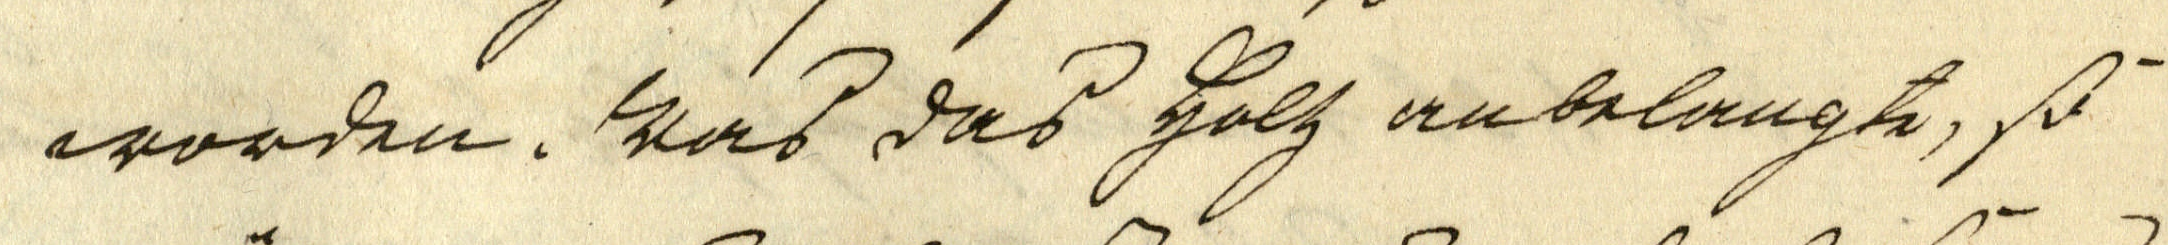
worden. Was das Holz anbelangte, so
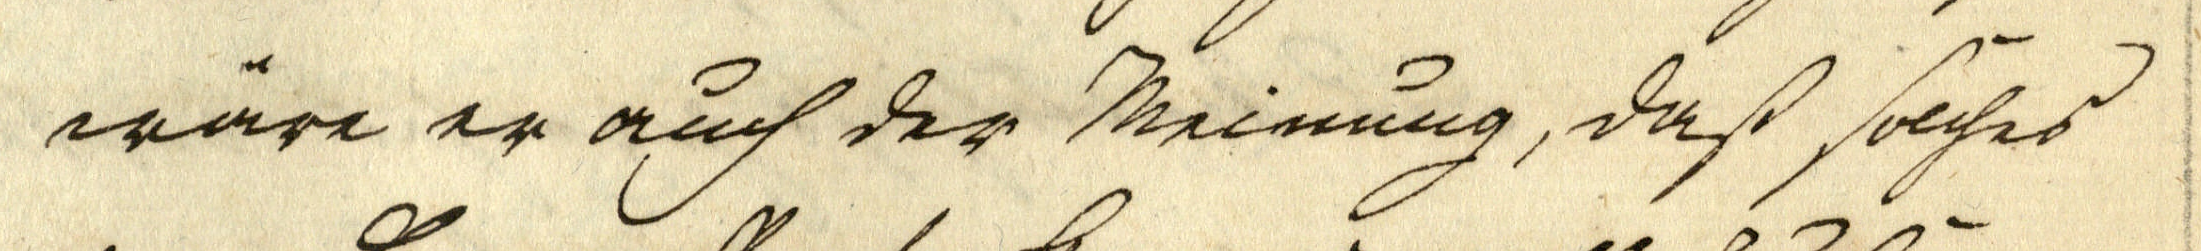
wäre er auch der Meinung, daß solches
